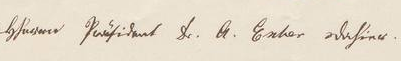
Hherrn Präsident Dr. A. Escher Dahier.
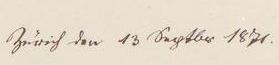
Zürich den 13 Septbr 1871.
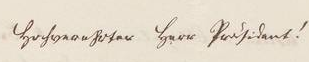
Hochverehrter Herr Präsident!
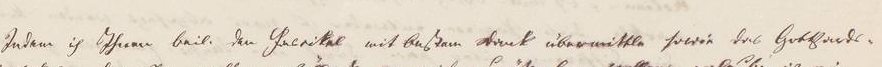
Indem ich Ihnen beil. den Fascikel mit bestem Dank übermittle sowie das Gotthards -
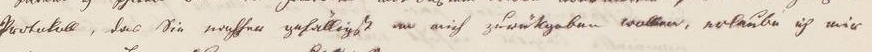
Protokoll, das Sie nachher gefälligst an mich zurükgeben wollen, erlaube ich mir
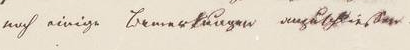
noch einige Bemerkungen anzuschließen.
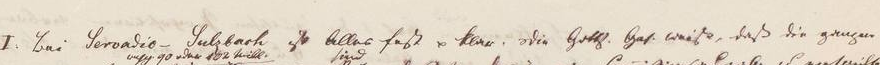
I. Bei Servadio-Sulzbach ist Alles fest & klar. Die Gotth. Ges. weiß, daß die ganzen
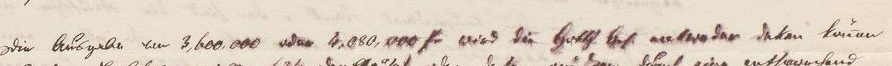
Die Ausgabe von 3,600,000 oder 4,080,000 fr wird die Gotth. Ges. entweder decken können
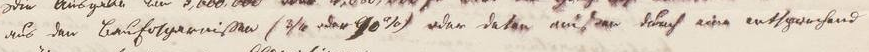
aus den BauErsparnißen (¾ oder 10%) oder deken müßen durch eine entsprechend
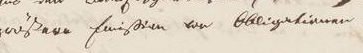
größere Emißion an Obligationen.
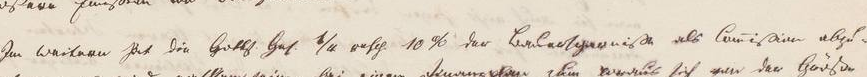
Im weitern hat die Gotth. Ges. ¼ resp. 10% der Bauersparniße als Commißion abzu-
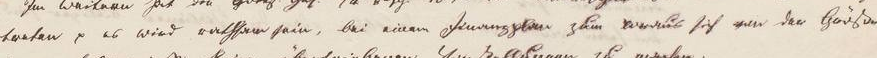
treten & es wird rathsam sein, bei einem Finanzplan zum voraus sich von der Größe
